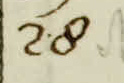28
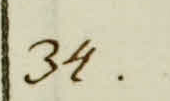34.
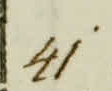41
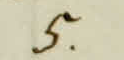5.
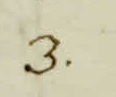3.
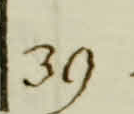39
